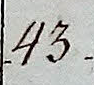43
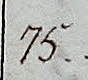75
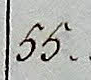55
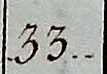33.
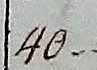40
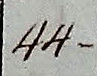44
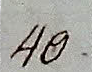40
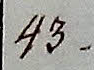43
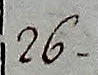26
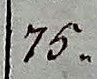75
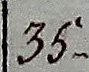35
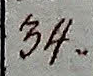34
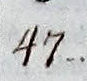47
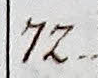72
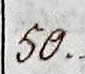50
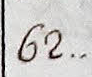62
